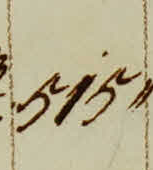515
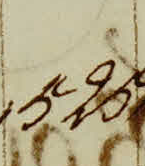525
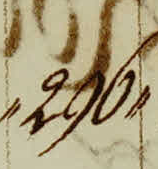296
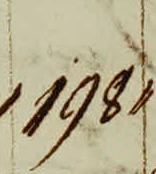198
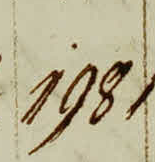198
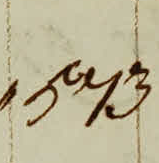573
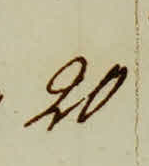20
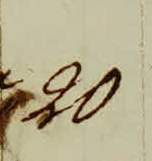20
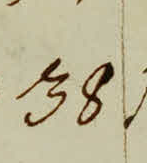38
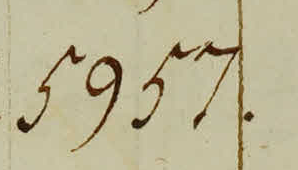5957.
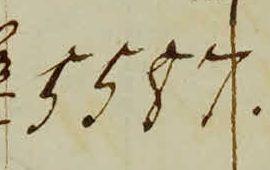5587
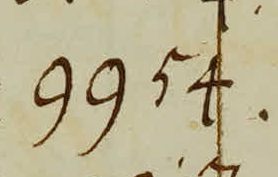9954
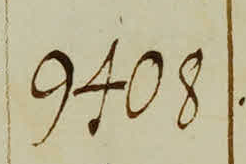9408
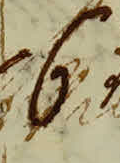6
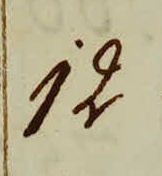12
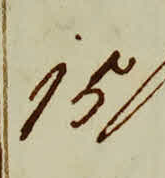15
